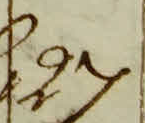27
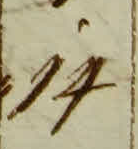14
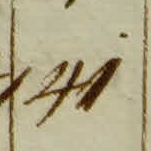41
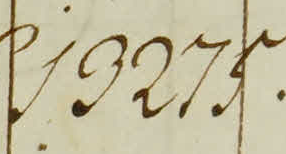13275
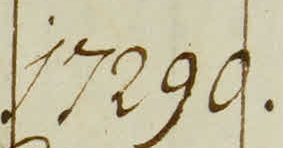17290
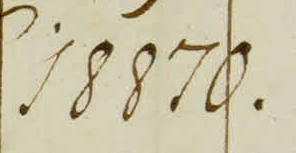18870.
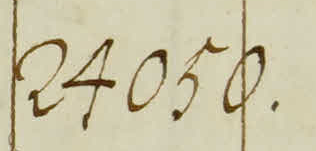24050.
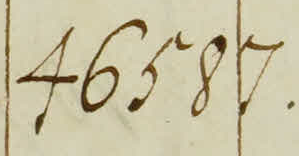46587
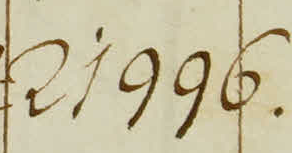21996
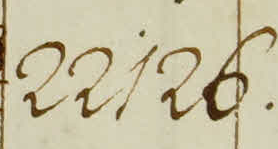22126
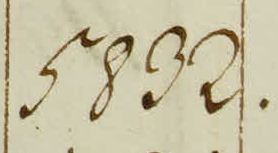5832
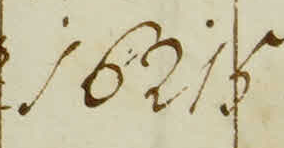16215
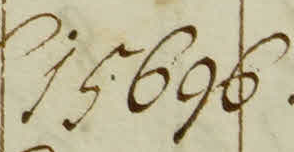15696
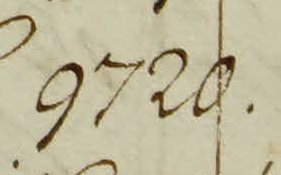9720.
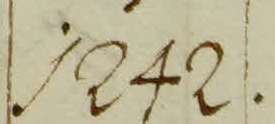1242
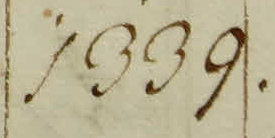1339
